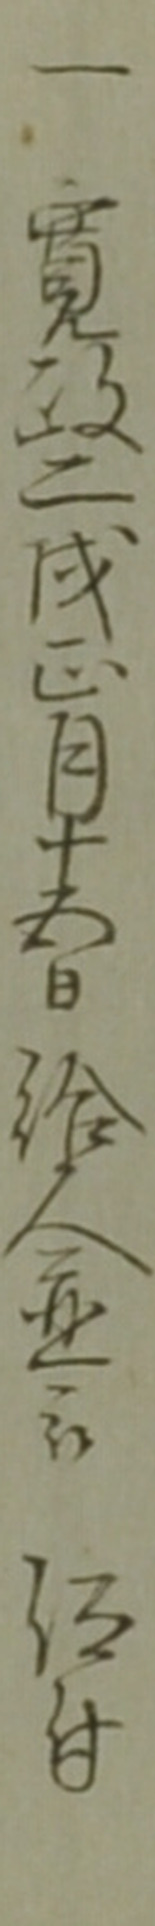一寛政二戌正月十五日給人並被仰付
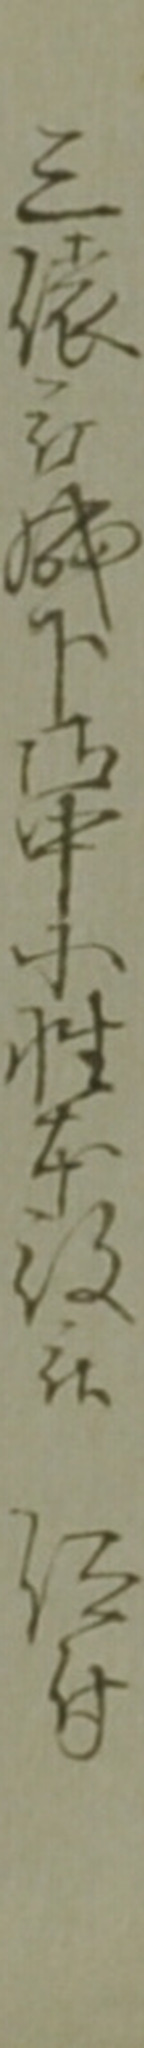三俵被成下御中小性本役被仰付
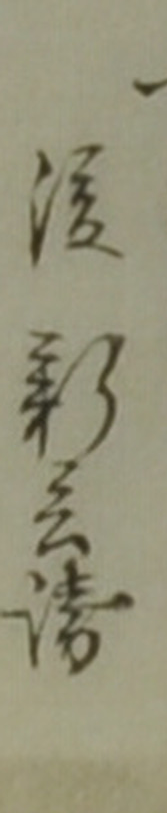後新兵衛
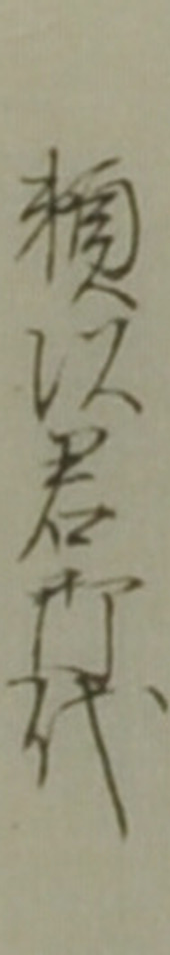頼以君御代
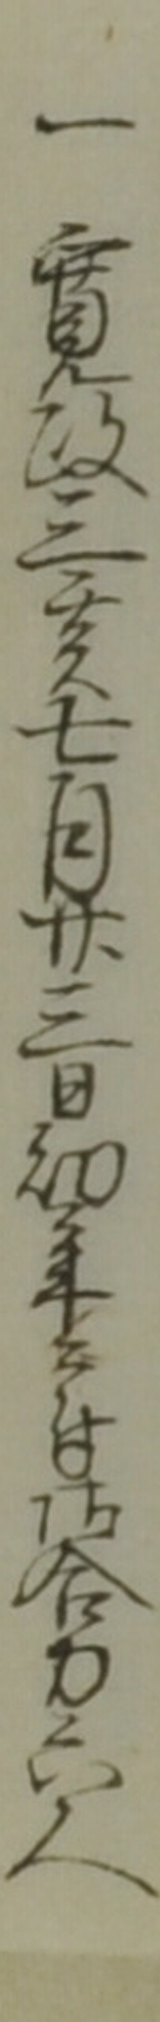一寛政三亥七月廿三日幼年ニ付御合力六人
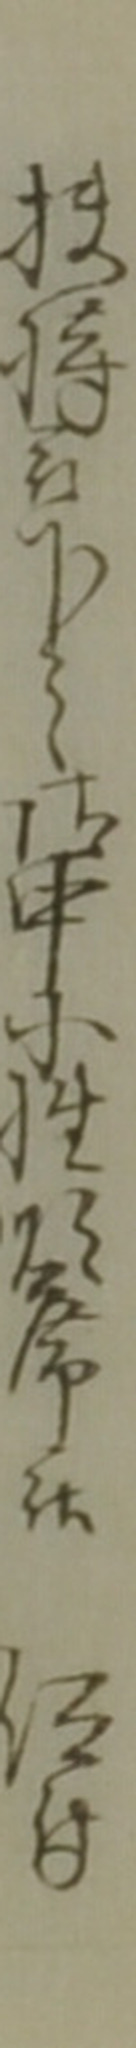扶持被下之御中小性順席被仰付
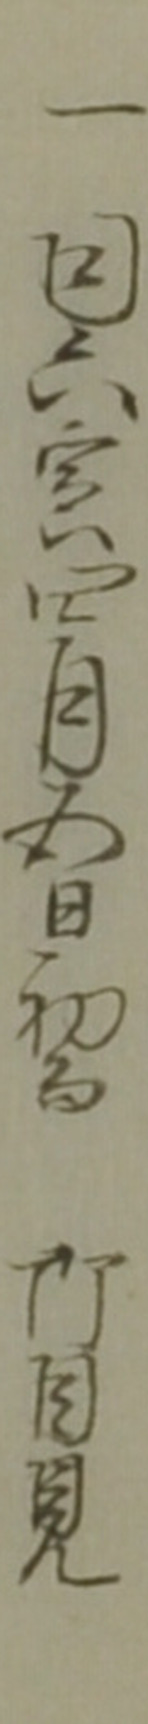一同六寅四月五日初而御目見
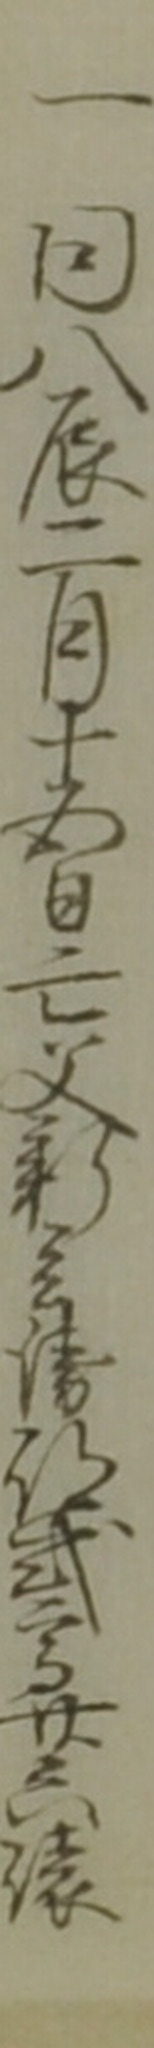一同八辰二月十五日亡父新兵衛跡式高廿六俵
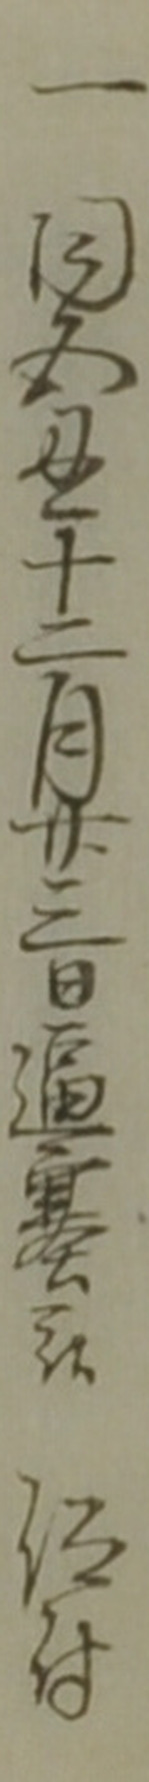一同五丑十二月廿三日逼塞被仰付
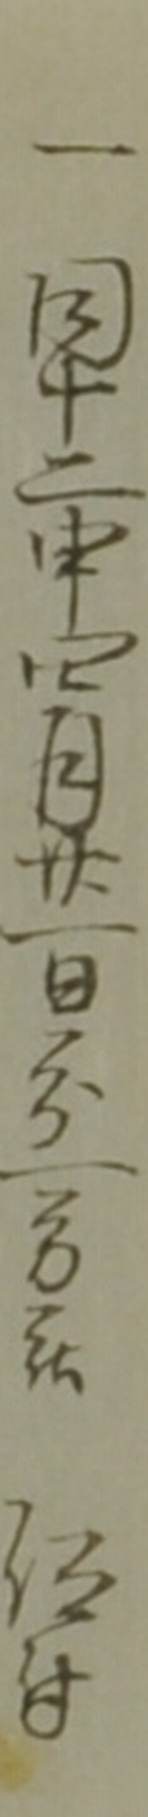一同十二申四月廿一日分一方被仰付
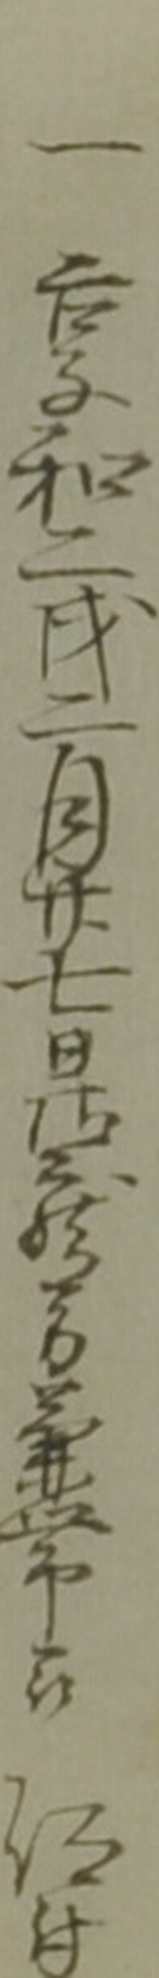一享和二戌二月廿七日御蔵方兼帯被仰付
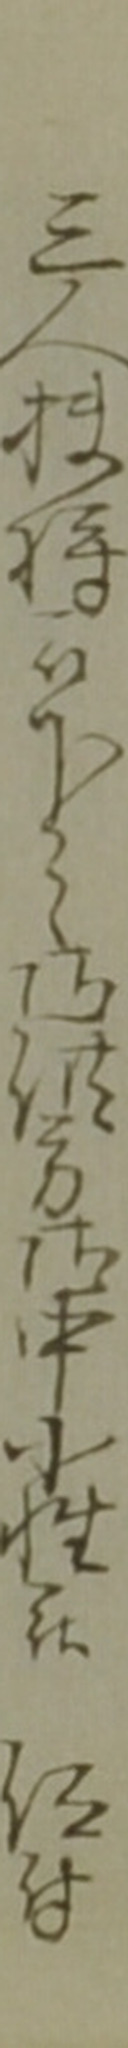三人扶持被下之御供方御中小性被仰付
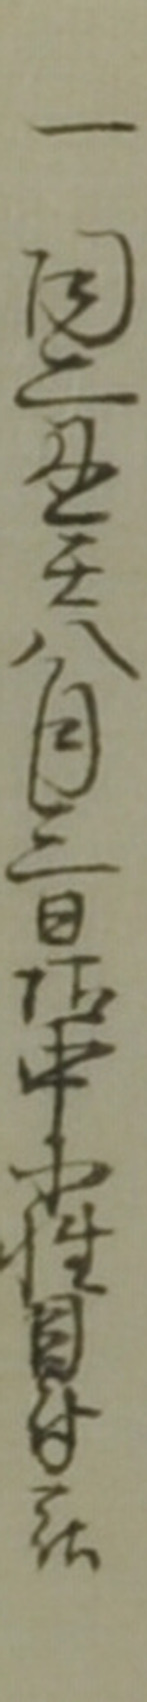一同二丑閏八月三日御中小性目付被
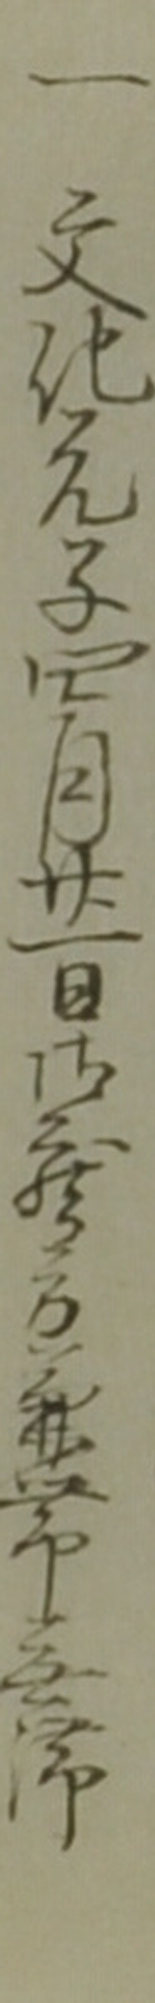一文化元子四月廿一日御蔵方兼帯無滞
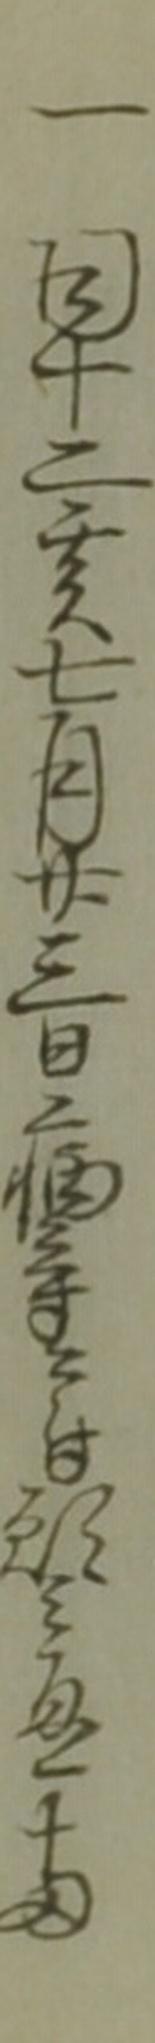一同十二亥七月廿三日病気ニ付願之通両
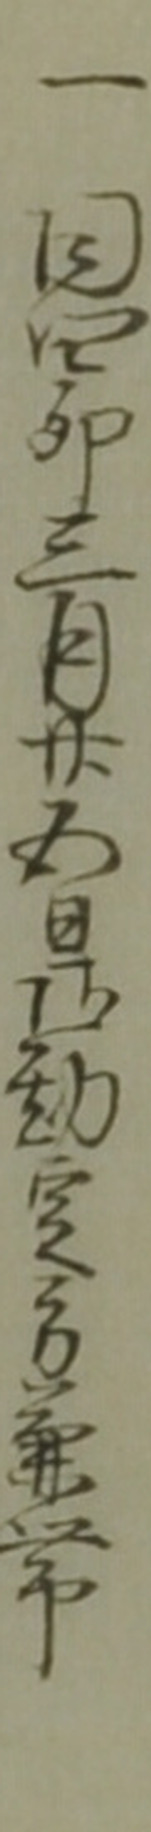一同四卯三月廿五日御勘定方兼帯
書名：無足諸士勤仕録（一）
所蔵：伊那市立高遠町図書館・合同会社AMANE
